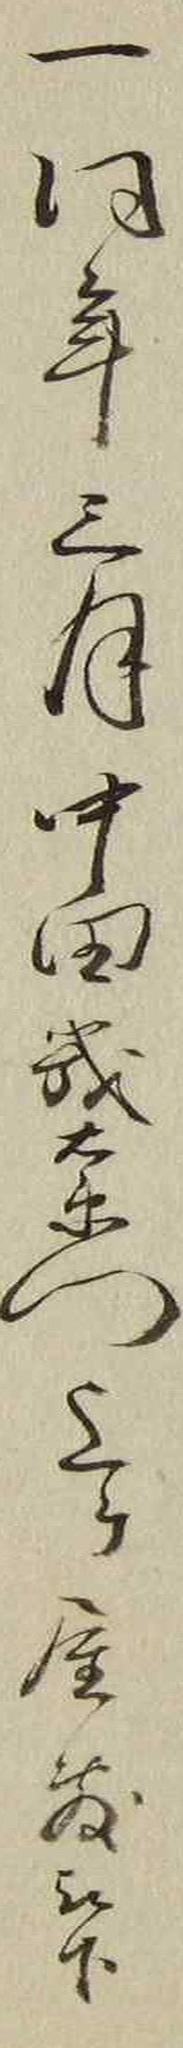一同年三月中田幾右衛門上ケ屋敷被下
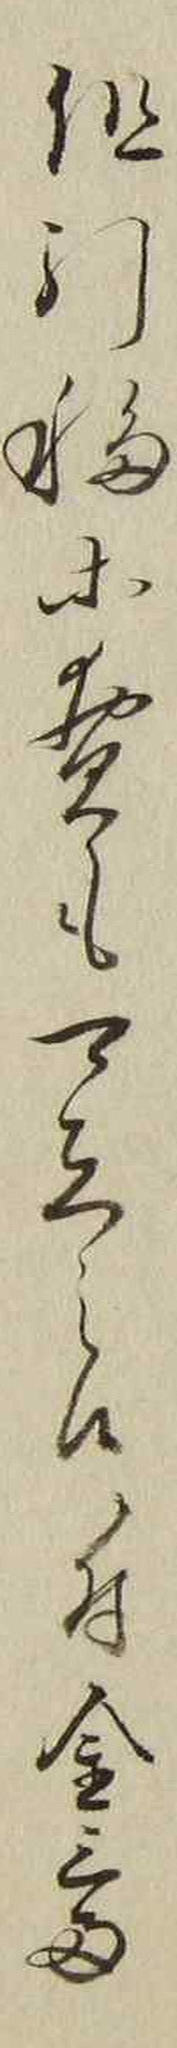但引移等費も可在之候ニ付金三両

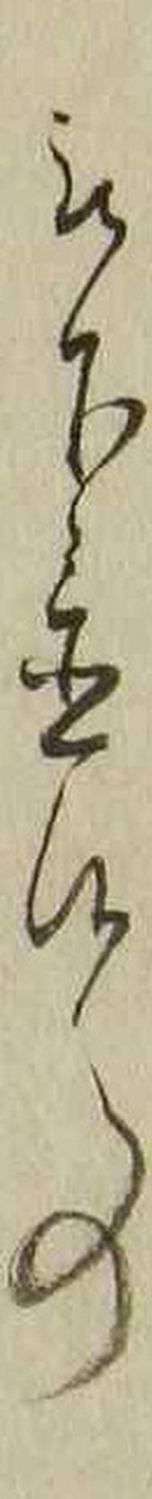被下置候事
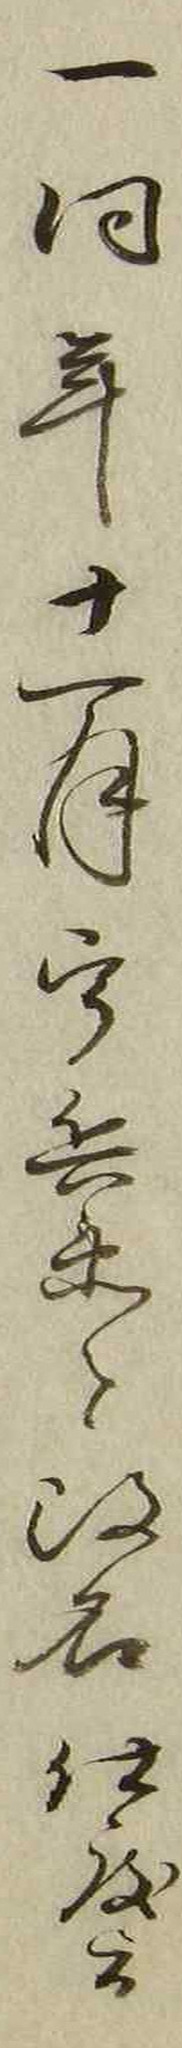一同年十一月宇兵衛と改名仕度旨
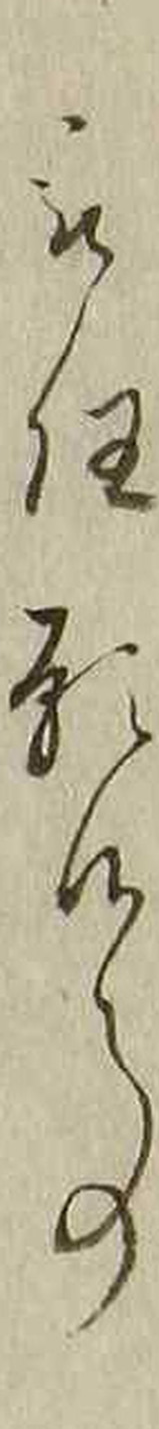被任願候事
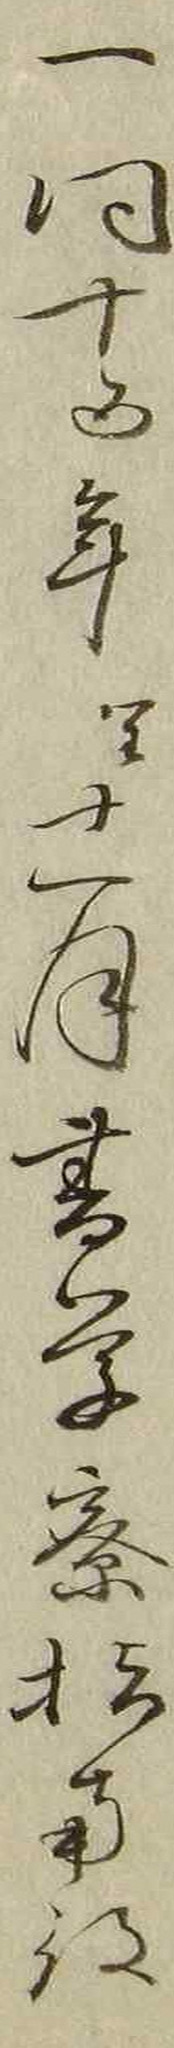一同十酉年閏十一月書学寮指南役
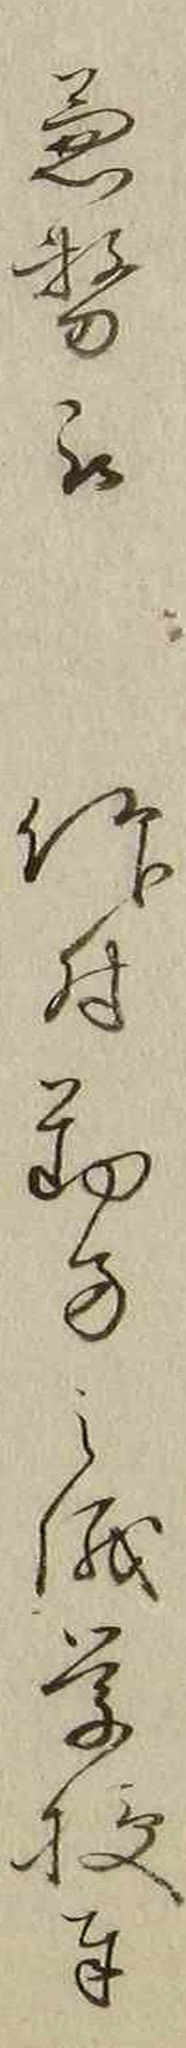兼務被仰付勤方之儀学授奉
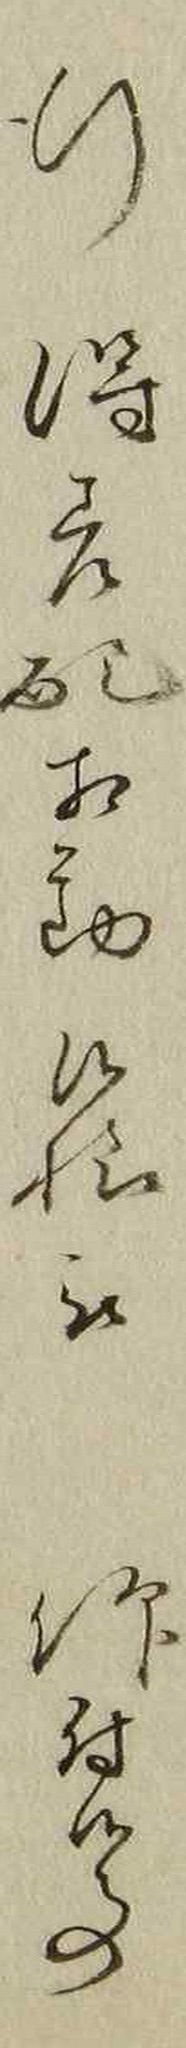行得差配相勤候様被仰付候事
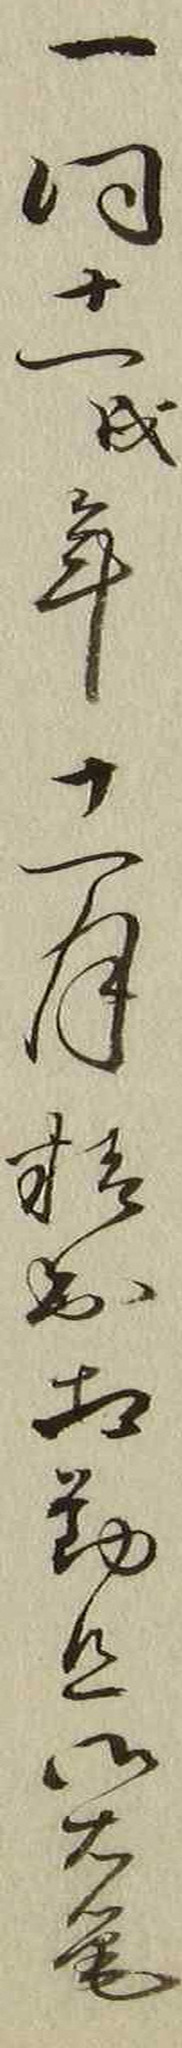一同十一戌年十一月精出相勤且御右筆
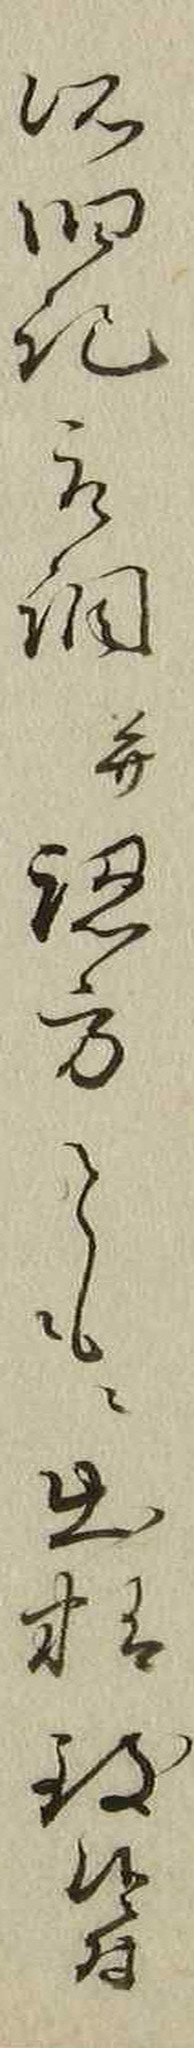所旧記取調并認方ともニ出精致候ニ付
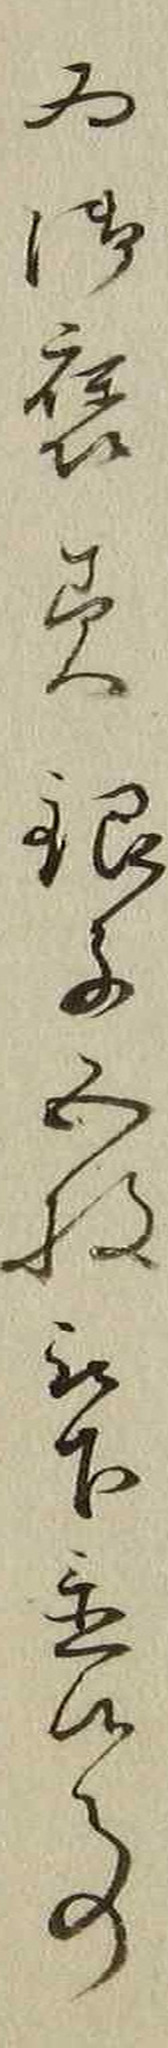為御褒美銀子五枚被下置候事
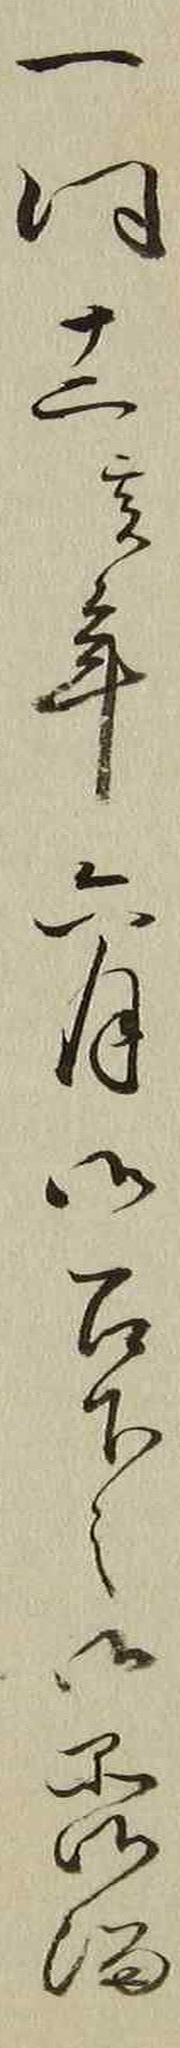一同十二亥年六月御召下之御品御溜
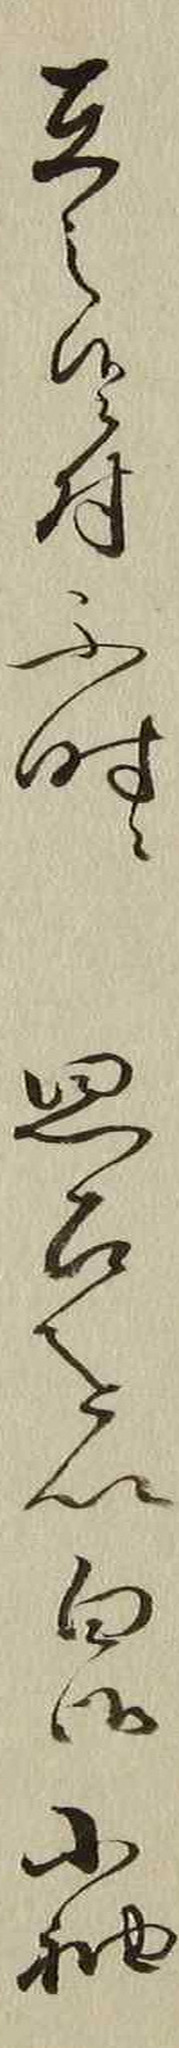在之候ニ付不時ニ思召を以白御小袖
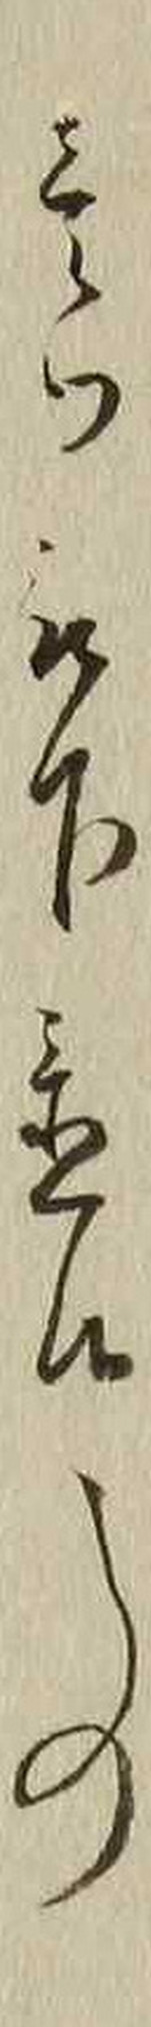壱ツ被下置候事
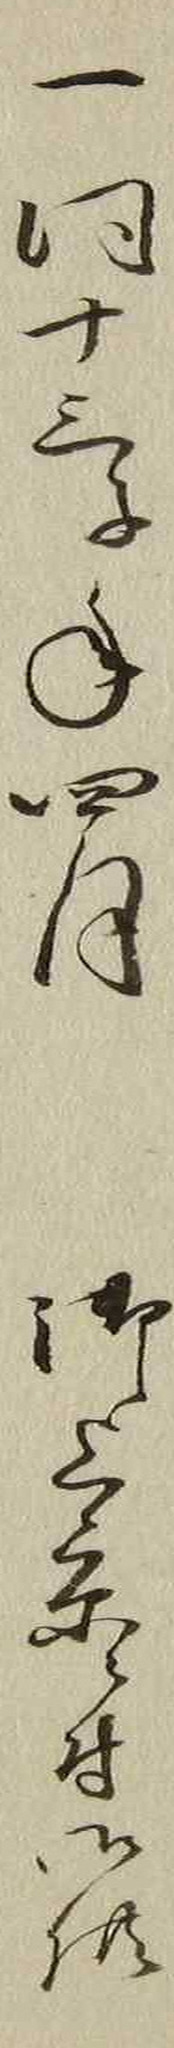一同十三子年四月御上京ニ付御供
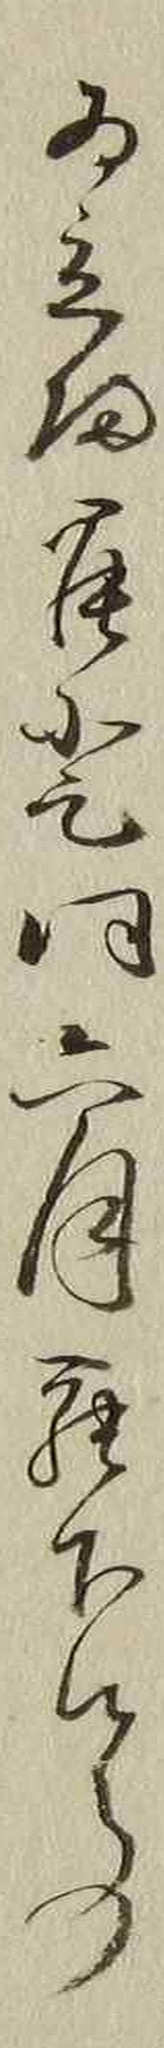為立帰罷登同六月罷下候事
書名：諸士系譜　巻之4　い之部4
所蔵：会津若松市立会津図書館
